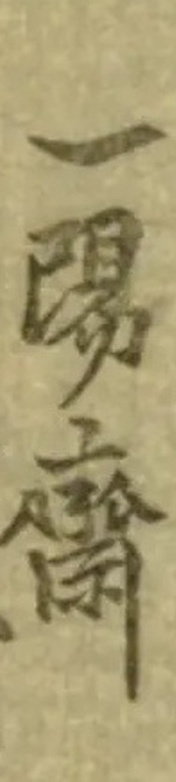一陽斎
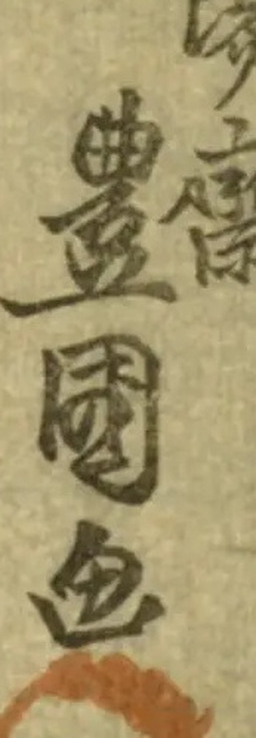豊国画
